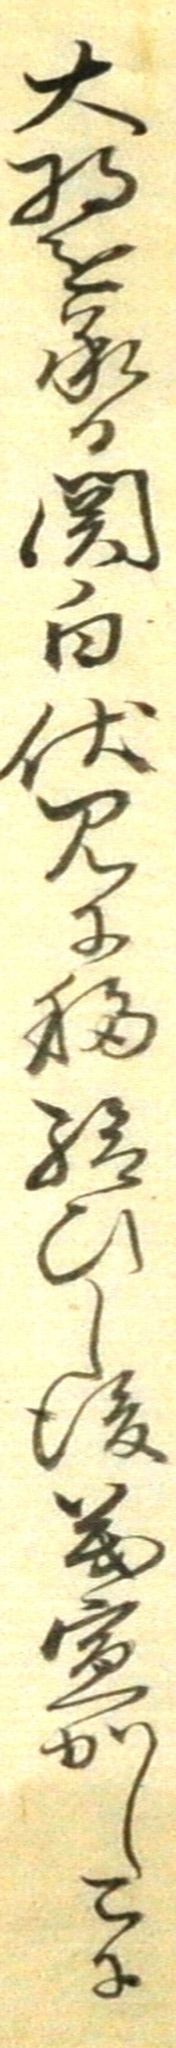大将を承る関白伏見に移給ひし後義宣かしこに
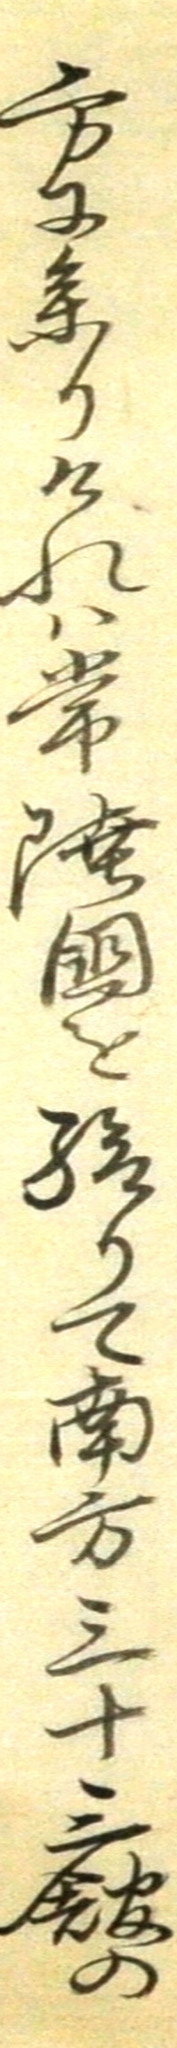方に参りけれは常陸国を給りて南方三十三館の
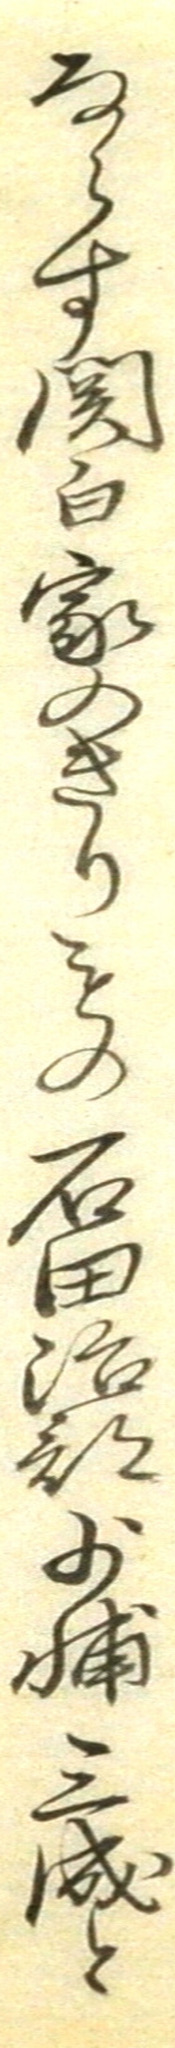ならす関白家のきりもの石田治部少輔三成と
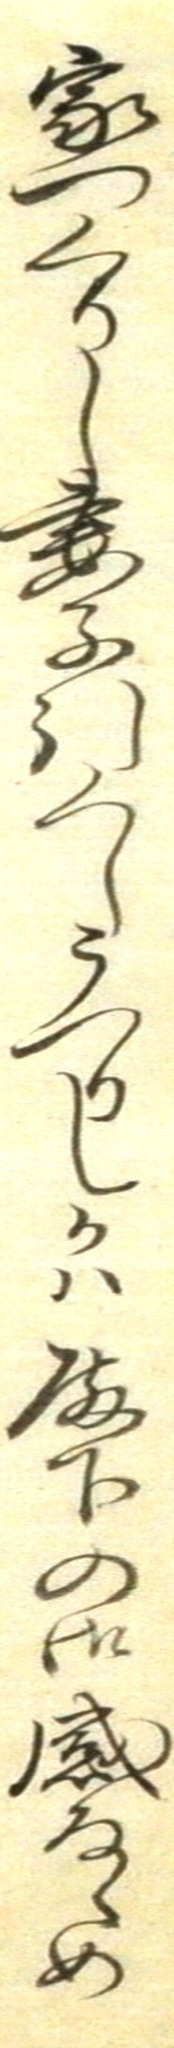家つくりし妻子引くしうつりしかは殿下の御感なゝめ
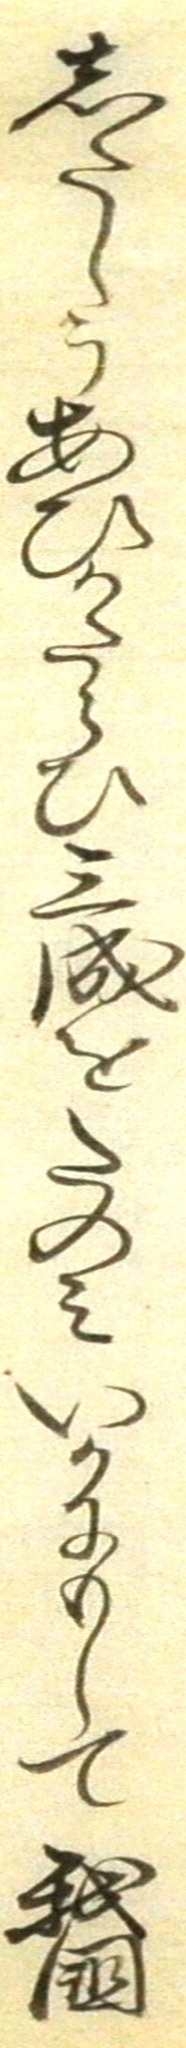したしうあひかたらひ三成をたのみいかにもして我国
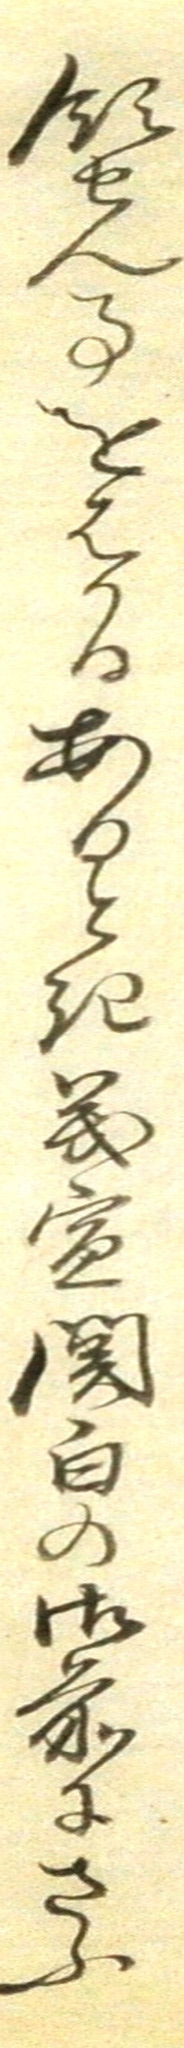領せん事をはかるあるとき義宣関白の御前にさふ
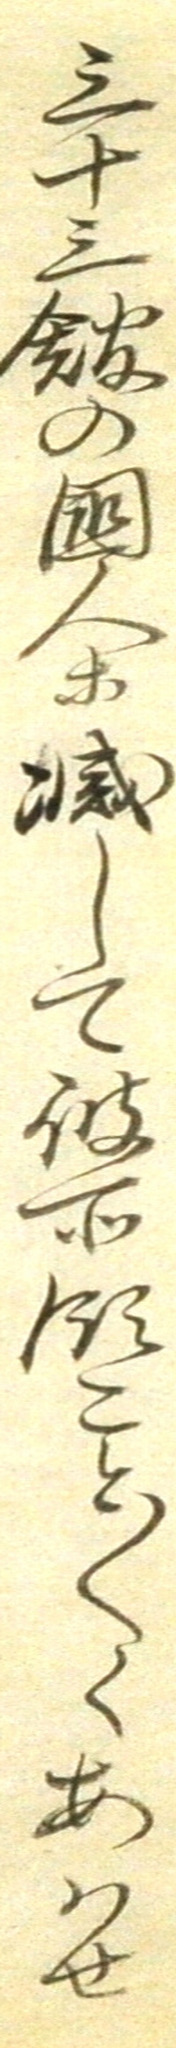三十三館の国人等滅して彼所領こと〳〵くあはせ
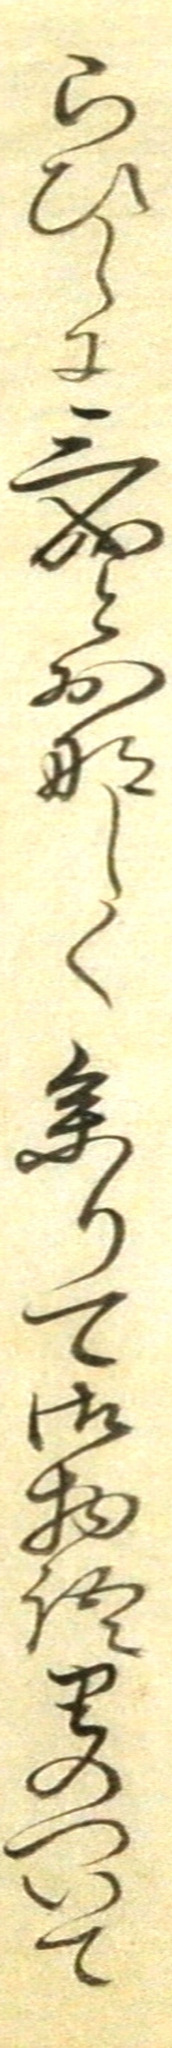らひしに三成とおなしく参りて御物語りのついて
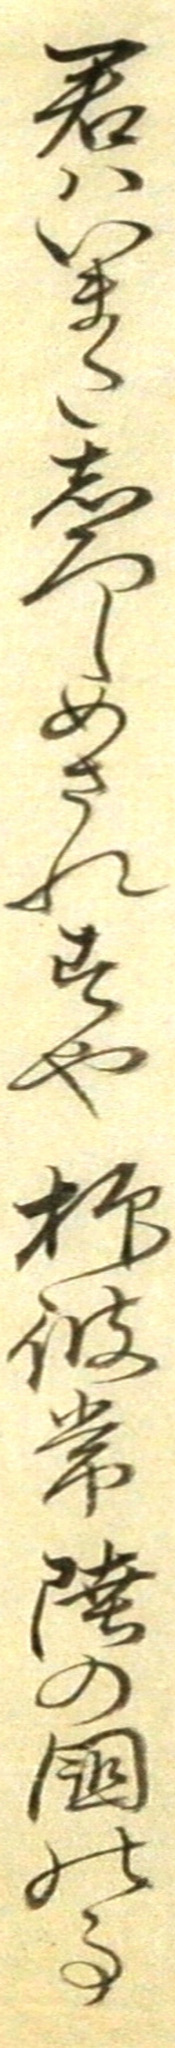君はいまたしろしめされすや抑彼常陸の国の事
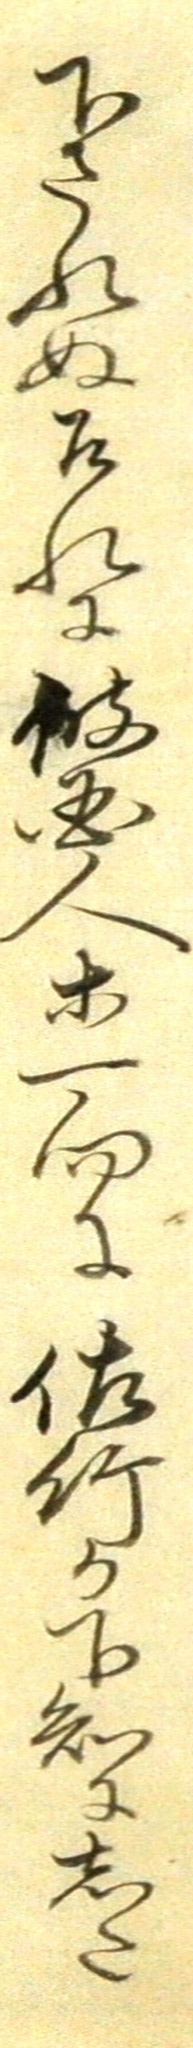下されぬそれに彼国人等一向に佐竹か下知にした
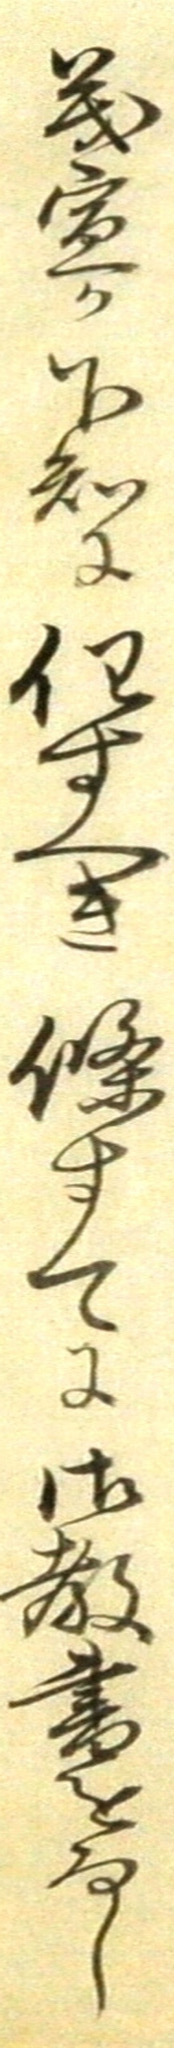義宣か下知に任すへき条すてよ御教書をなし
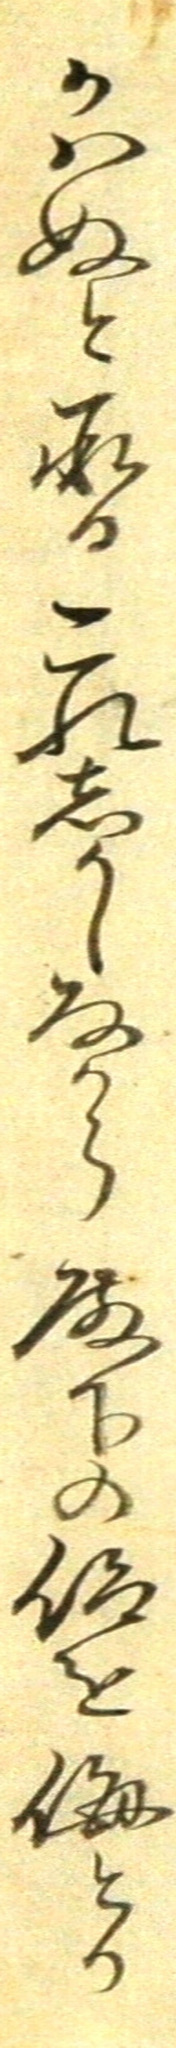かはぬと承るこれしかしなから殿下の仰を侮とり

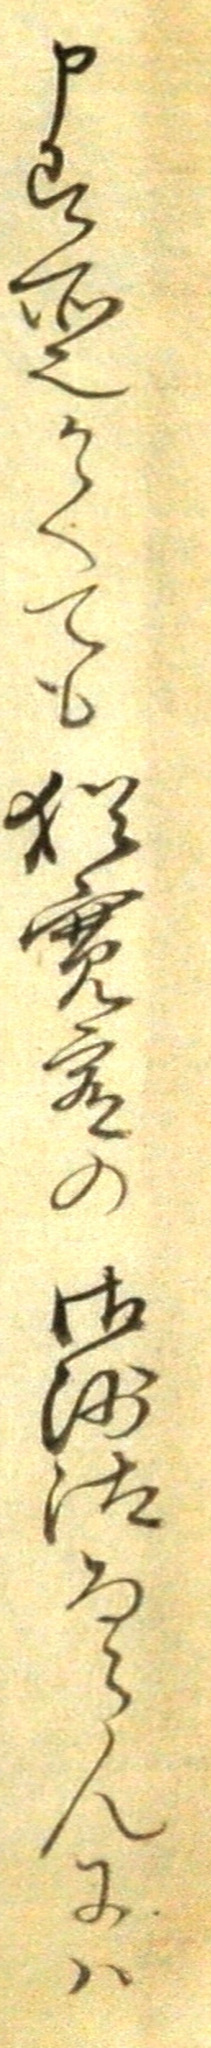申す所也かくても猶寛宥の御沙汰ならんには
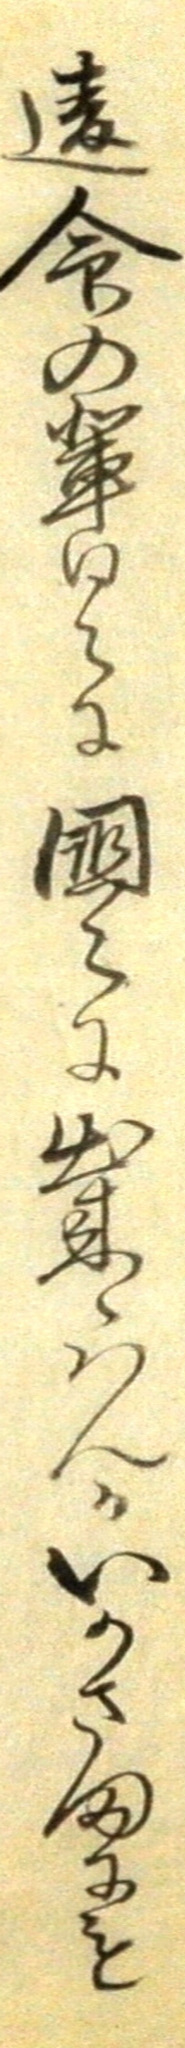違命の輩日々に国々に出来候はんかいかさまにも
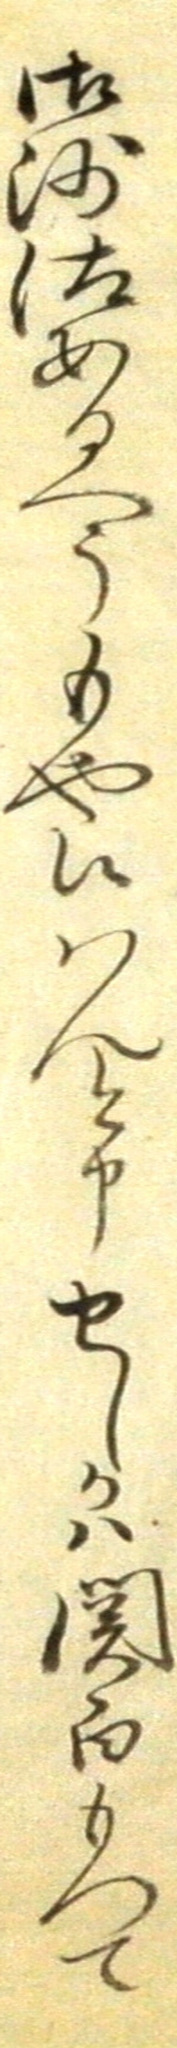御沙汰あるへうもや候はんと申せしかは関白もつて
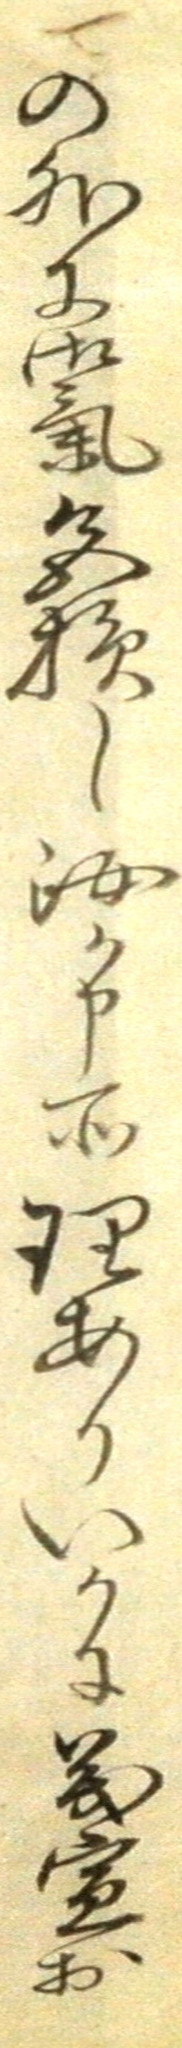の外に御気色損し汝か申所理ありいかに義宣お
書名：藩翰譜（八・下）
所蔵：伊那市立高遠町図書館・合同会社AMANE
